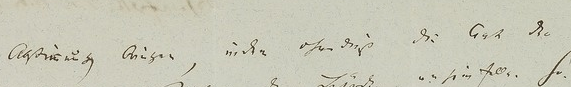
Abstimmung bringen, indem ohnedieß die Last der
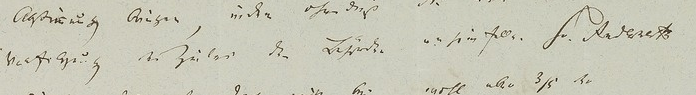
Verfrachtung des Zieles den Behörden anheimfalle. HrAnderwerth
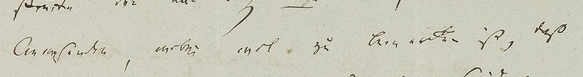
Anwesenden, wobei wol zu bemercken ist, daß
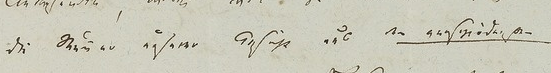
die Männer unserer Ansicht aus den verschiedensten
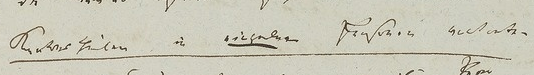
Kantonstheilen in einzelnen Personen vertreten
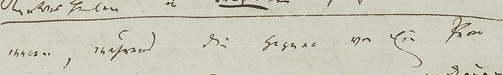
waren, während die Gegner von Ein Paar
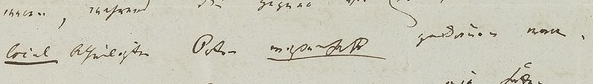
local betheiligten Orten maßenhaft gekommen waren.
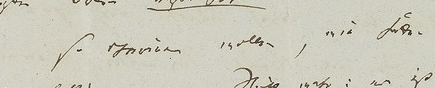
so operiren wollen, wir hätten
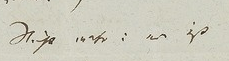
Nicht wahr: es ist
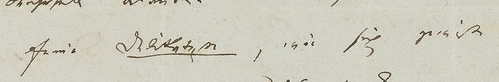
feine Delikateße, wie sich gewiße
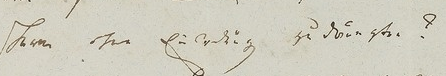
Herrn ohne Einladung zudrängten?
